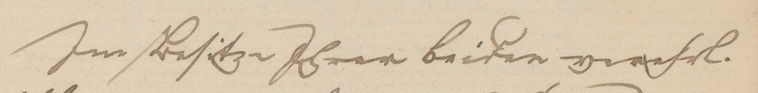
Im Besitze Ihrer beiden verehrl.
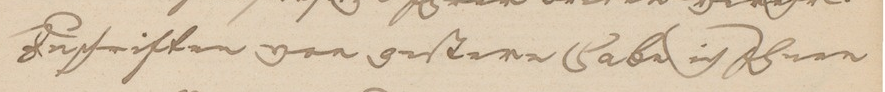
Zuschriften von gestern habe ich Ihnen
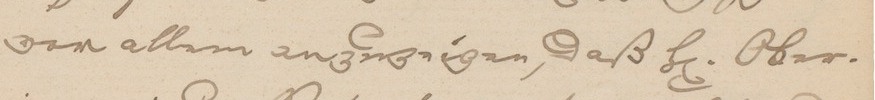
vor allem anzuzeigen, daß H. Ober-
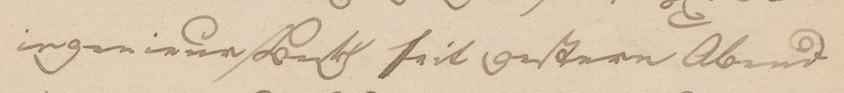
ingenieur Beckh seit gestern Abend
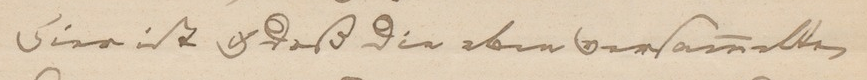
hier ist & daß die eben versammelte
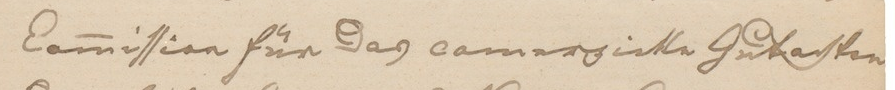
Commission für das comerzielle Gutachten
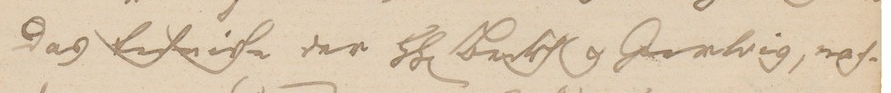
das technische der HH Beckh & Gerwig, nach-
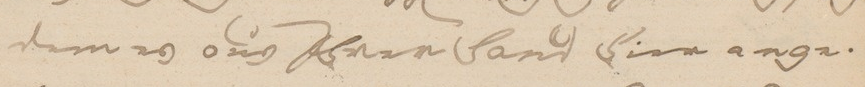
dem es aus Ihrer Hand hier ange-
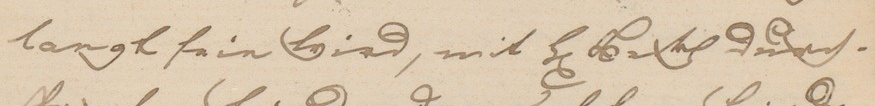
langt sein wird, mit H Beckh durch-
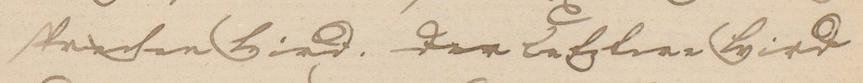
sprechen wird. Der letztere wird
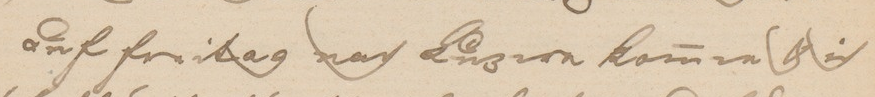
auf Freitag nach Luzern kommen & ich
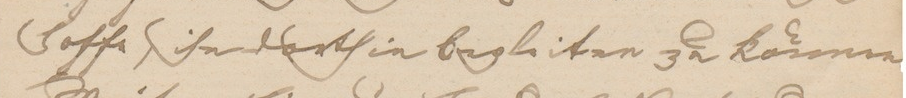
hoffe, ihn dorthin begleiten zu können.
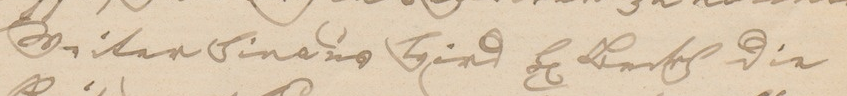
Weiter hinaus wird H Beckh die
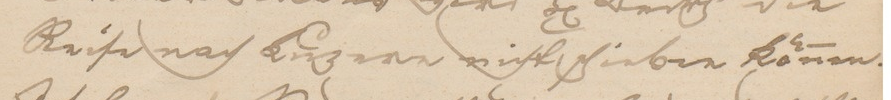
Reise nach Luzern nicht schieben können.
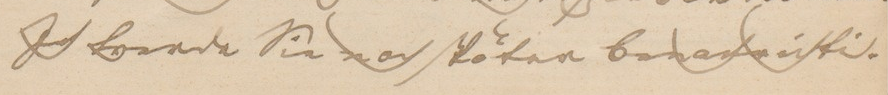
Ich werde Sie noch später benachrichti-
